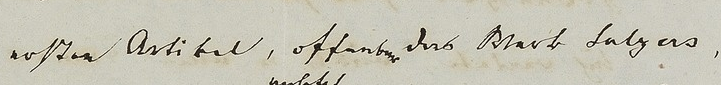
ersten Artikel, offenbar das Werk Sulzers,
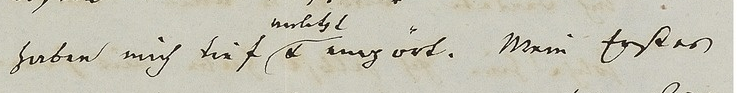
haben mich tief verletzt & empört. Mein Erstes
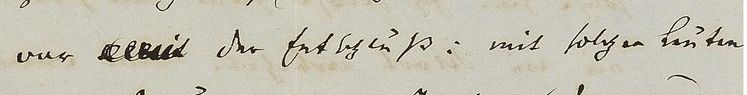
war ... der Entschluß: mit solchen Leuten
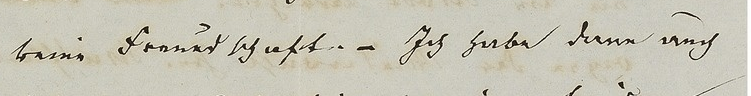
keine Freundschaft. – Ich habe dann auch
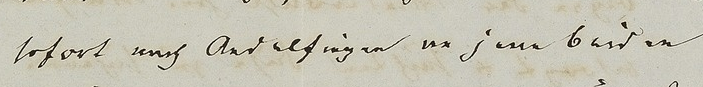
sofort nach Andelfingen an jene beiden
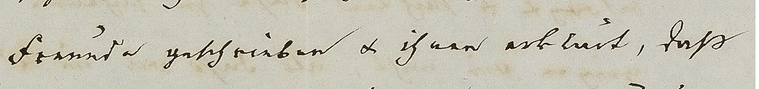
Freunde geschrieben & ihnen erklärt, daß
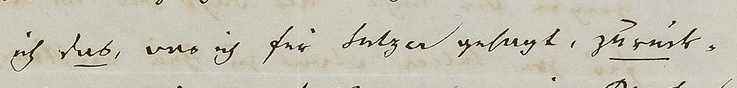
ich das, was ich für Sulzer gesagt, zurück-
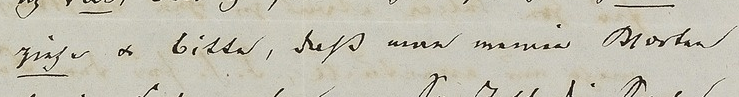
ziehe & bitte, daß man meinen Worten
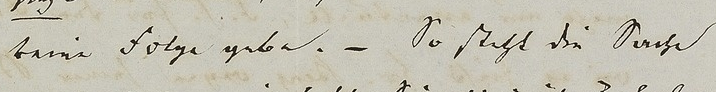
keine Folge gebe. – So steht die Sache
